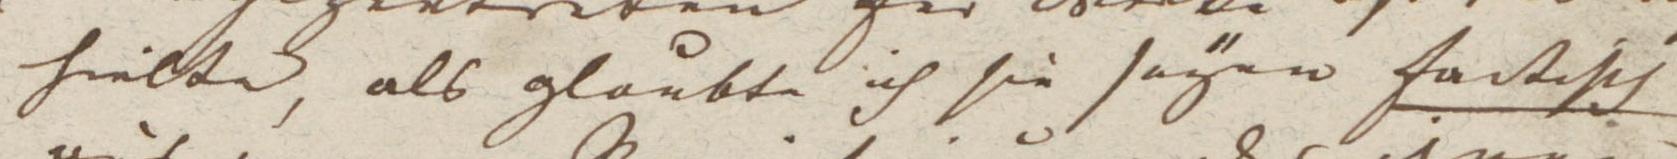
hielte, als glaubte ich sie seyen factisch
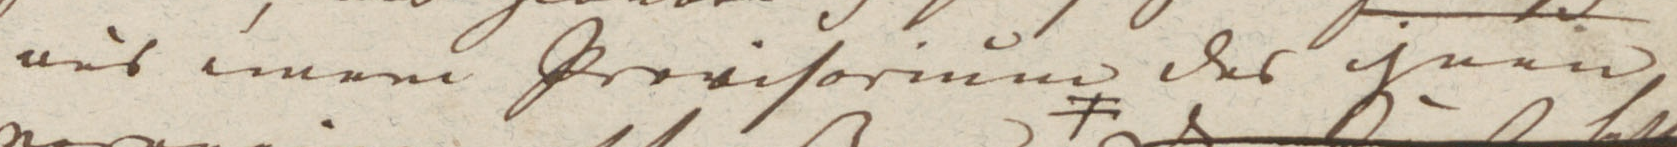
aus einem Provisorium das ihnen
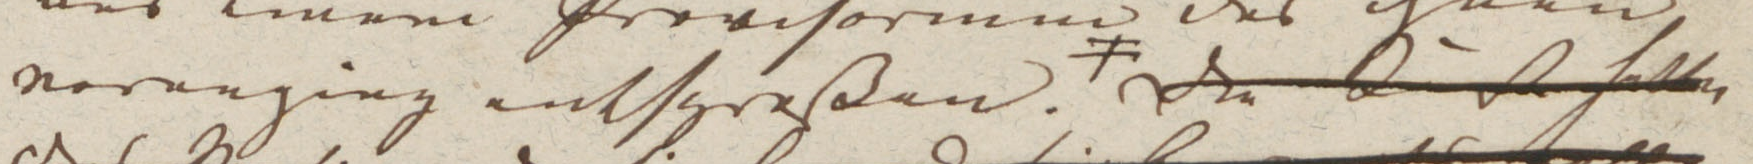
voranging entsprossen. % Die Kunst hatte
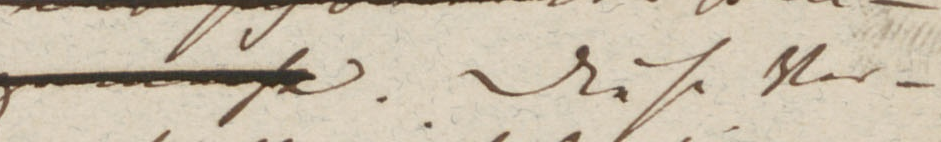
gemacht. Diese Ver-
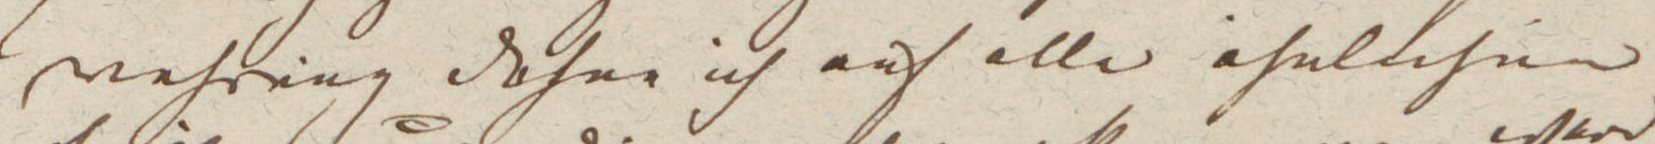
wahrung dehne ich auf alle ähnlichen
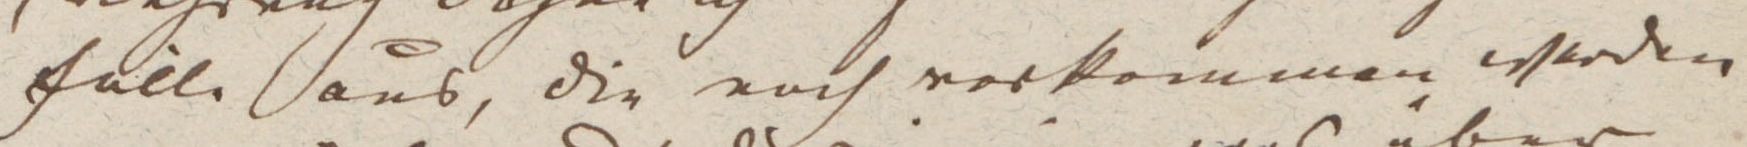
Fälle aus, die noch vorkommen werden
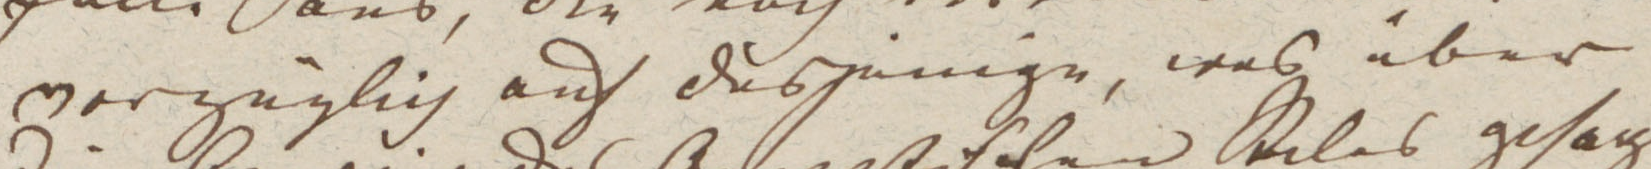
vorzüglich auf dasjenige, was über
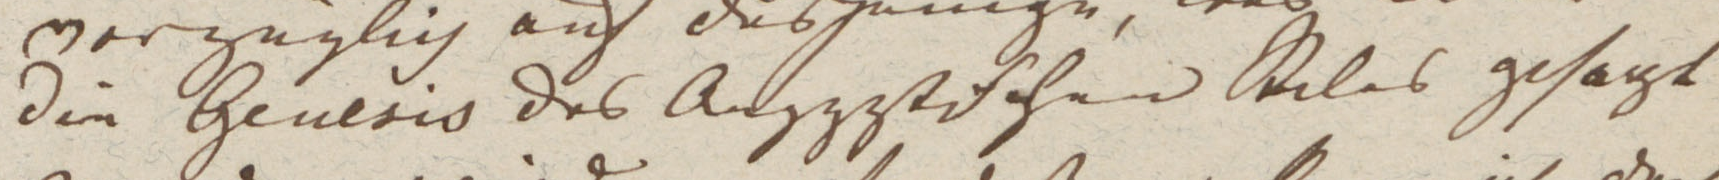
die Genesis des Aegyptischen Stiles gesagt
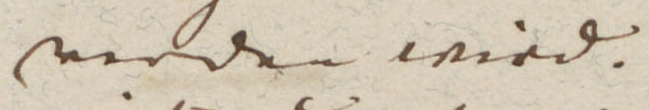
werden wird.
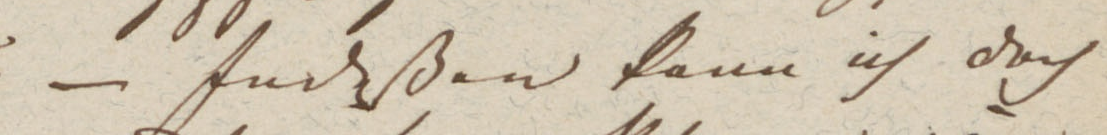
– Indessen kann ich doch
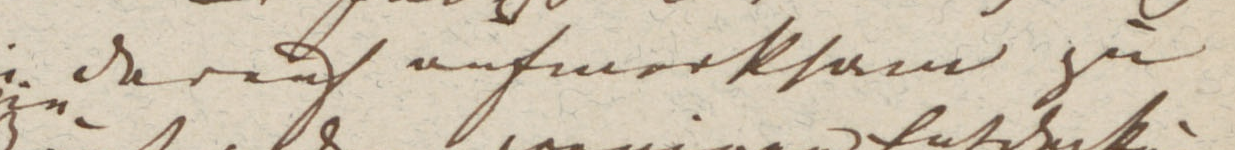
darauf aufmerksam zu
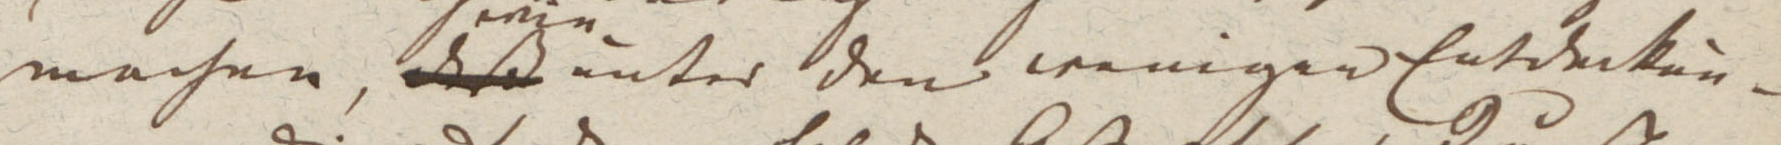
machen, dass wie unter den wenigen Enteckun-
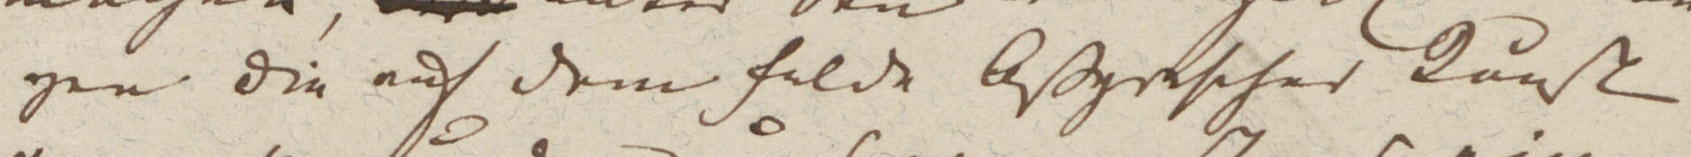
gen die auf dem Felde Assyrischer Kunst
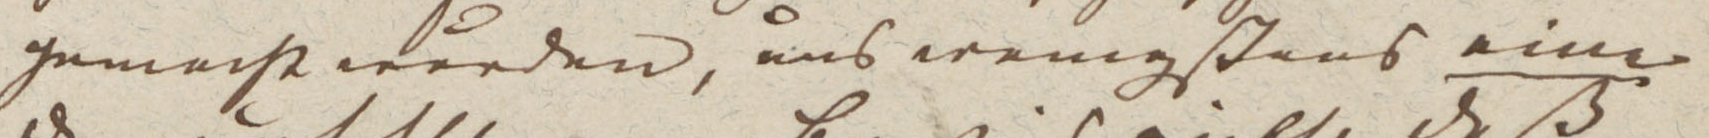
gemacht wurden, uns wenigstens eine
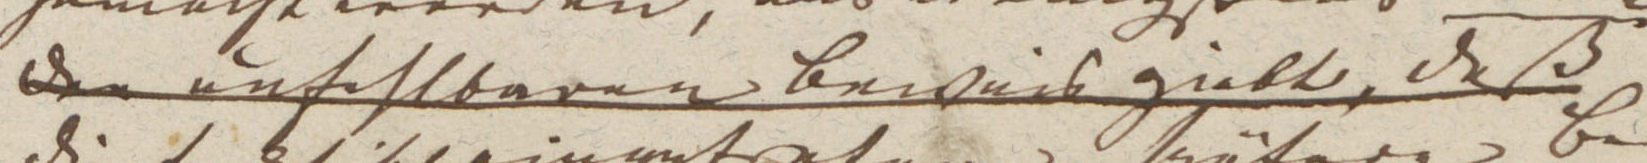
den unfehlbaren Beweis giebt, dass
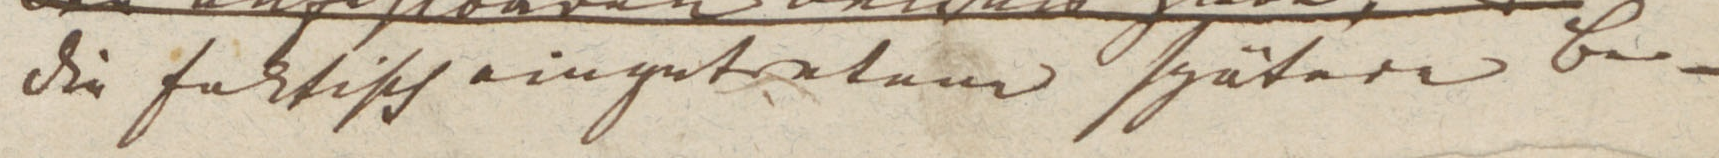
die faktisch eingetretene spätere Be-
